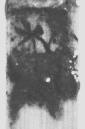焚
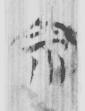宗
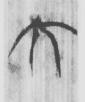大
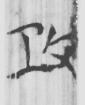攻
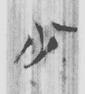少
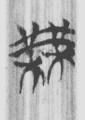無
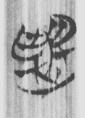𪴿
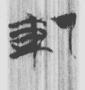{車卩}
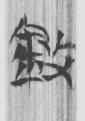{金攴}
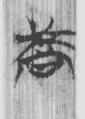喬
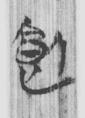飤
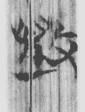毀
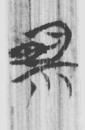{明示}
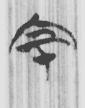{宀主}
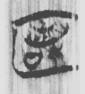匿
